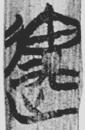遇
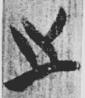之
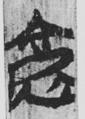被（披）
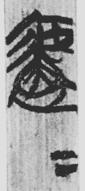○（襌衣）
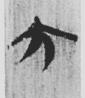大
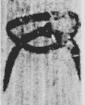尹
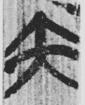內
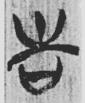告
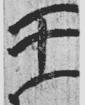王
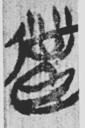○（僕）
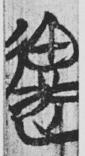遇
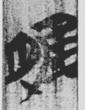○（脽）
